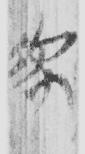虎
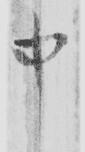中
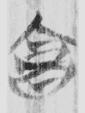合
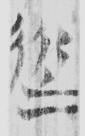從
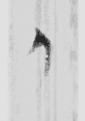人
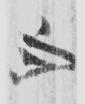之
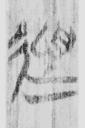道
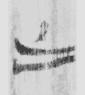止
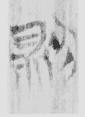則
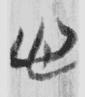心
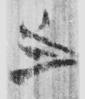之
